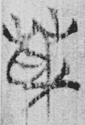菜
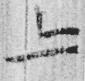上
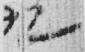九
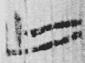亡（无）
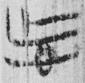忘
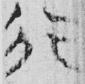行
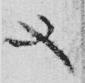又（有）
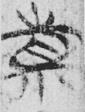○（眚）
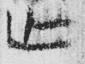亡（无）
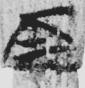○（攸）
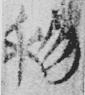利
